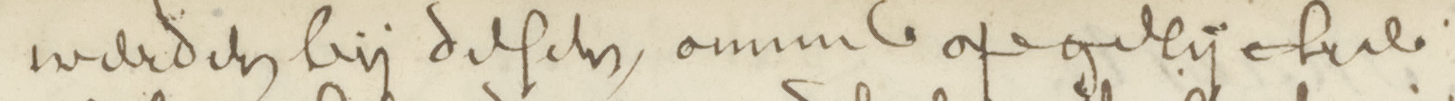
werden bij desen, omme op gelijcke
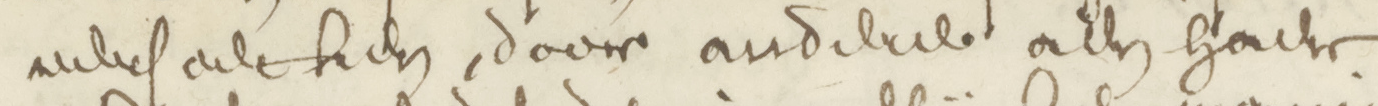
versoecken, door andere aen haer
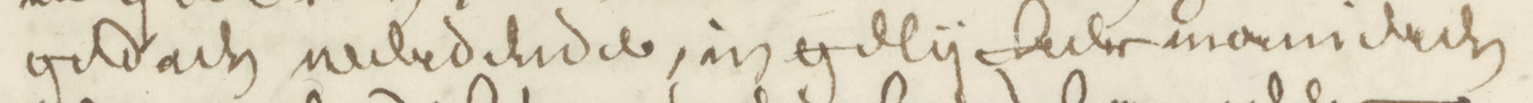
gedaen werdende, in gelijcker manieren
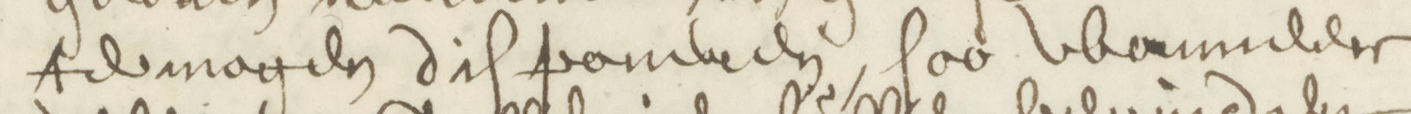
te mogen disponeren, soo wanneer
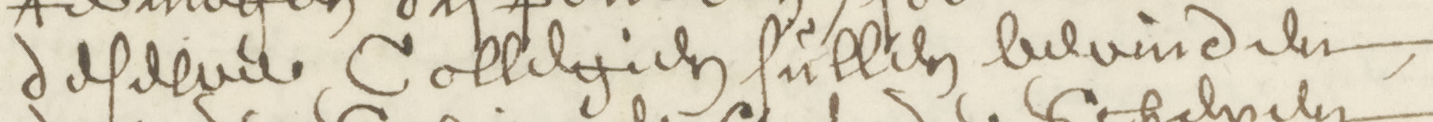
deselve Collegien sullen bevinden,
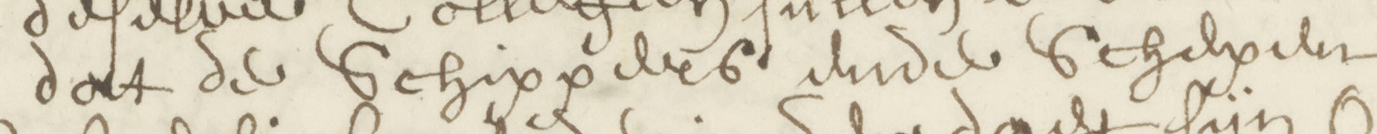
dat de Schippers ende Schepen
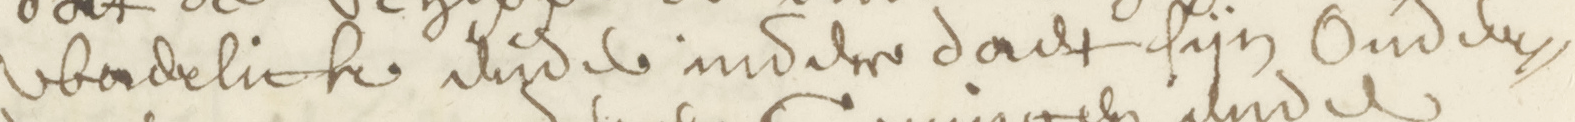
waerlick ende inder daet sijn Onder„
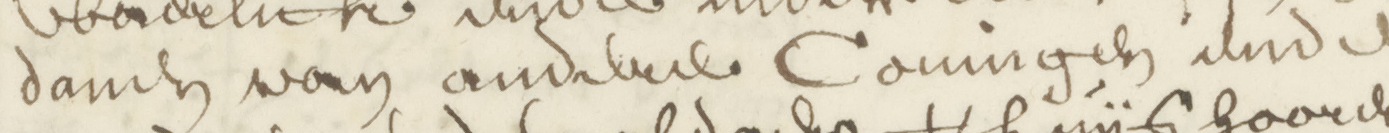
danen van andere Coningen ende
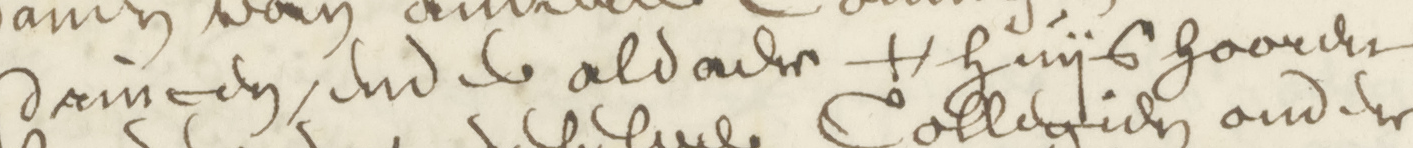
Princen, ende aldaer t‛huijs hooren
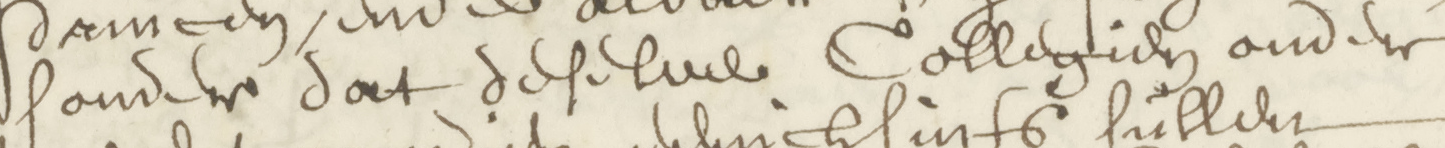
sonder dat deselve Collegien onder
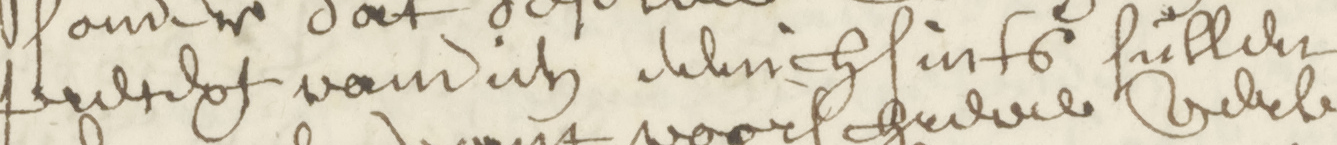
pretext vandien eenichsints sullen
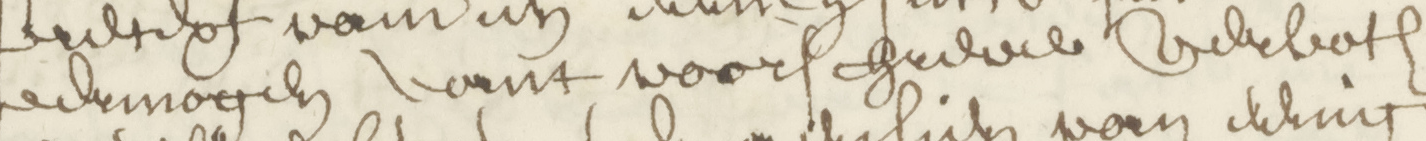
vermogen vant voorschreve verboth
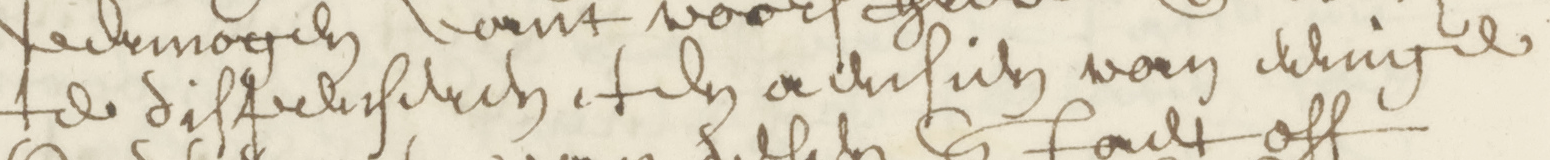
te dispenseren, ten aensien van eenige
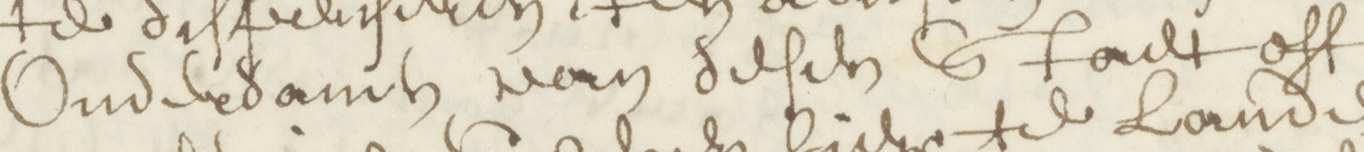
Onderdanen van desen Staet off
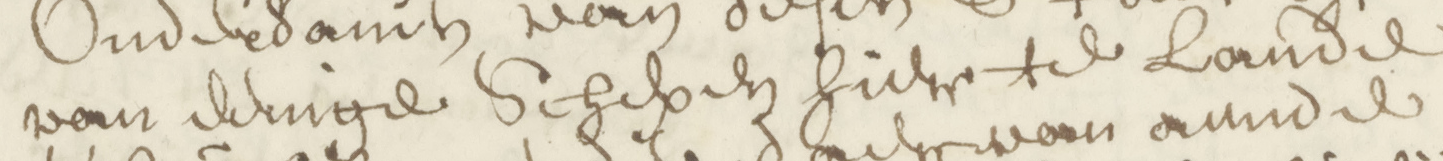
van eenige Schepen hier te Lande
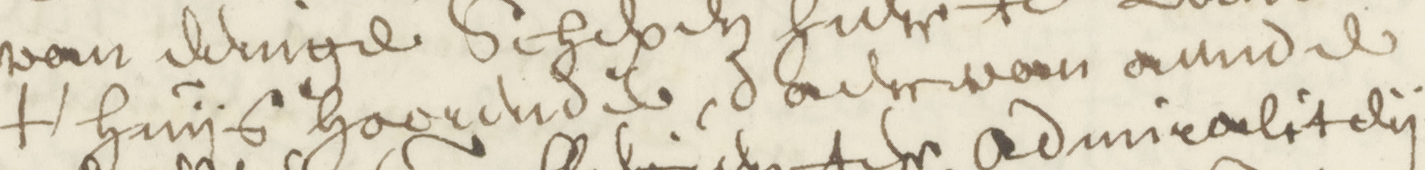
t'huijs hoorende, daervan aende
